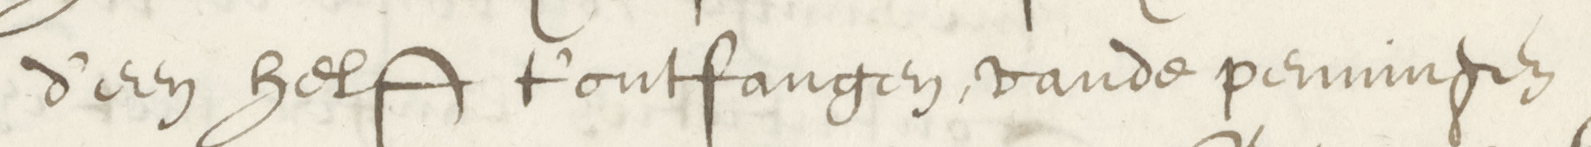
d'een helft t'ontfangen, vande penningen
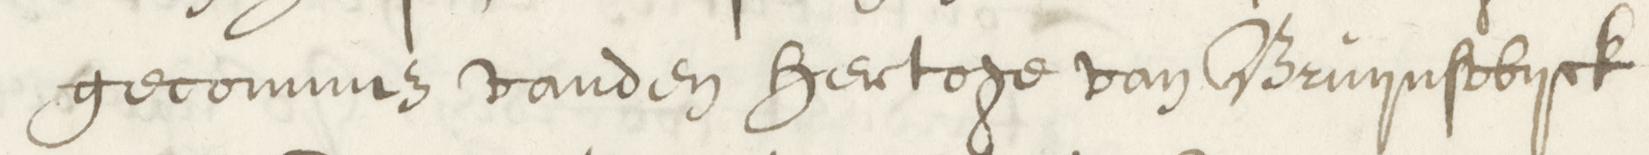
gecommen vanden hertoge van Bruynswyck
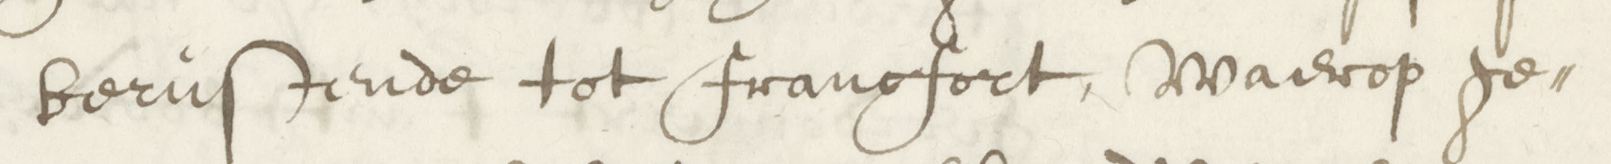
berustende tot francfort. Waerop ge„
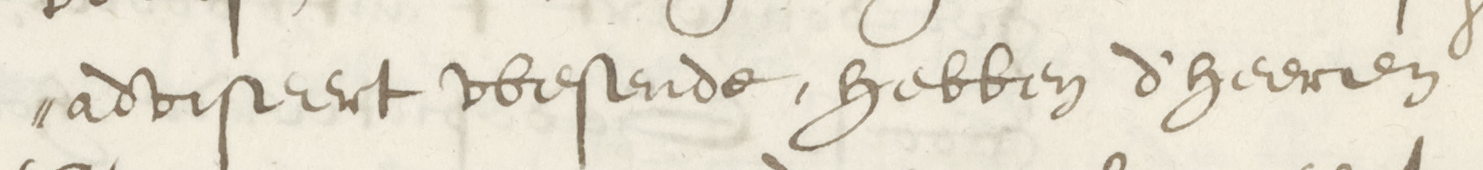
,,adviseert wesende, hebben d'heeren
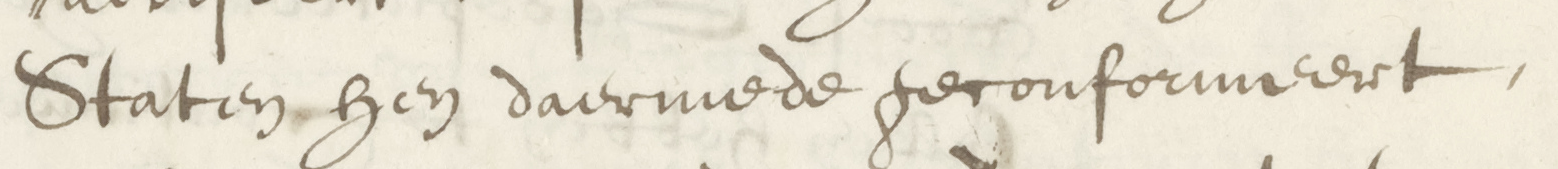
Staten hen daermede geconformeert,
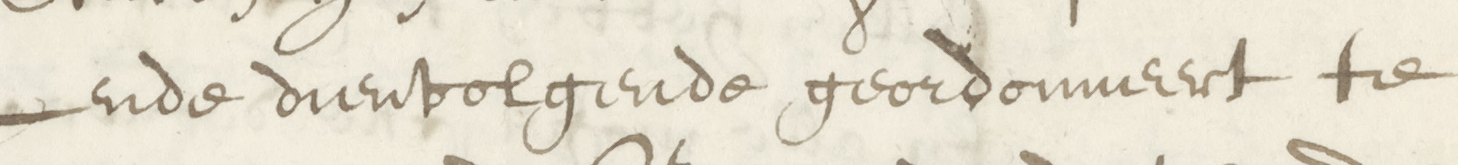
ende dienvolgende geordonneert te
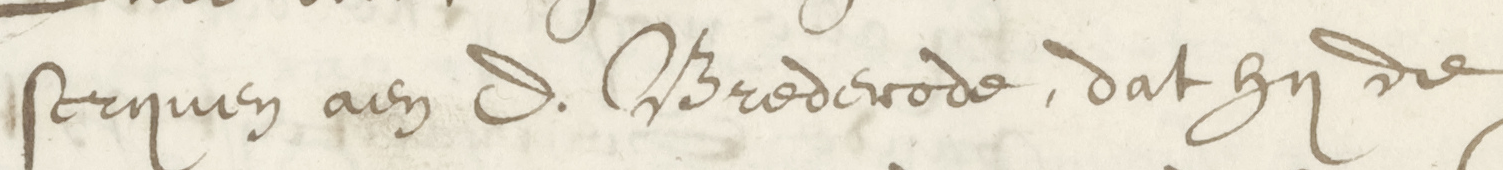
scryven aen D. Brederode, dat hy de
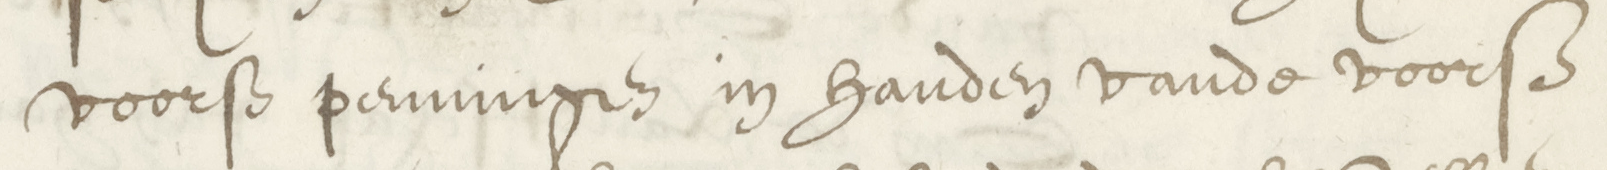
voors penningen in handen vande voors
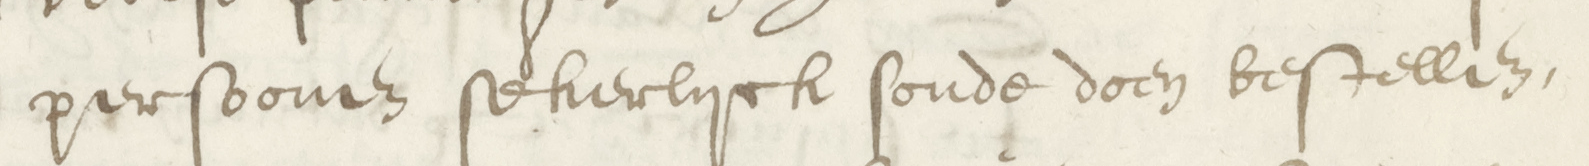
persoonen sekerlyck soude doen bestellen,
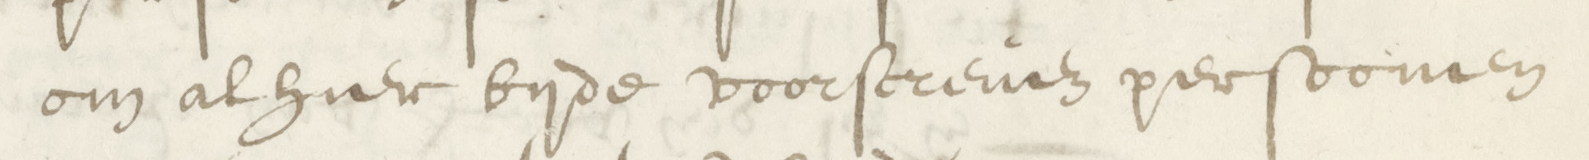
om alhier byde voorscreuen persoonen
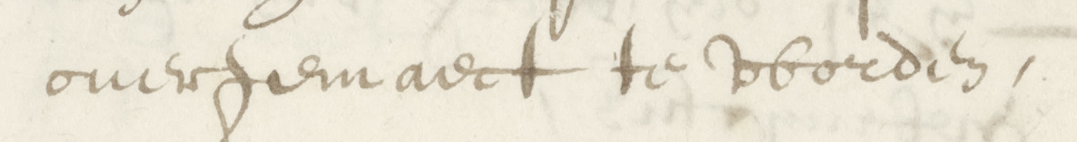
overgemaect te worden.
